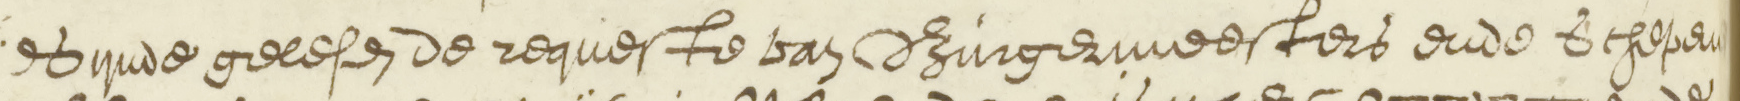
Sijnde gelesen de requeste van Burgermeesters ende Schepen
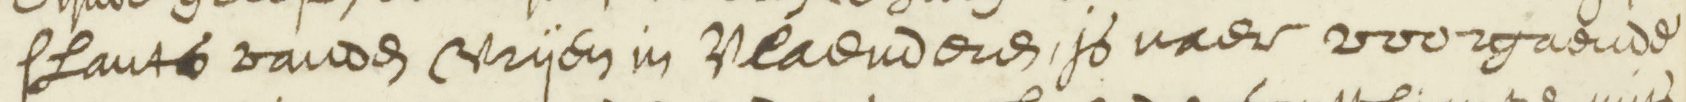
sLants vanden Vrijen in Vlaenderen, is naer voorgaende
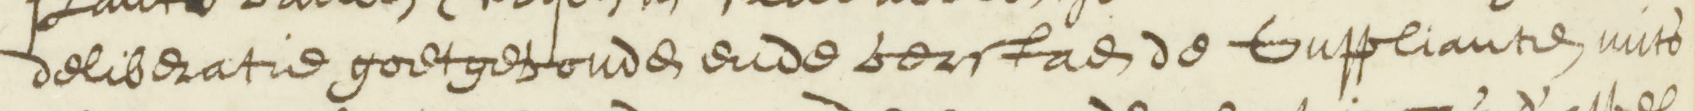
deliberatie goetgevonden ende verstaen de Supplianten mits
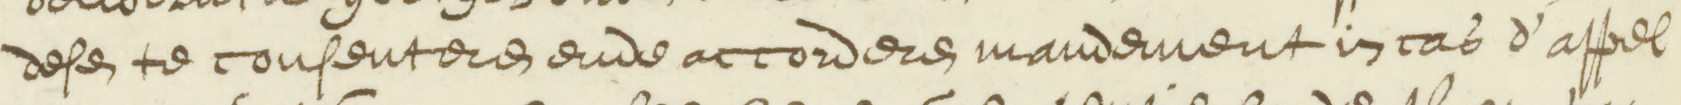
desen te consenteren ende accorderen mandement in cas d'appel
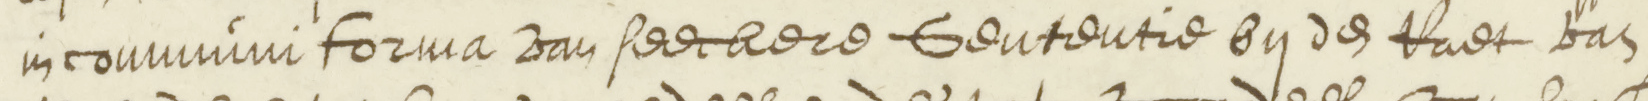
in communi forma van seeckere Sententie by den Raet van
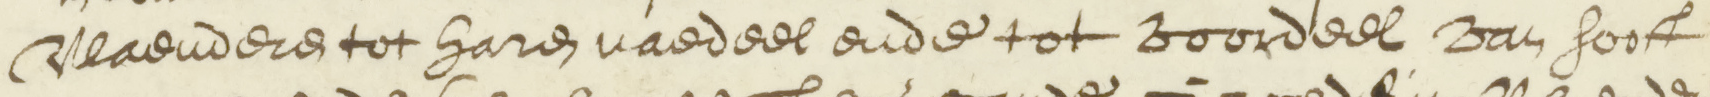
Vlaenderen tot haren naedeel ende tot voordeel van hooft
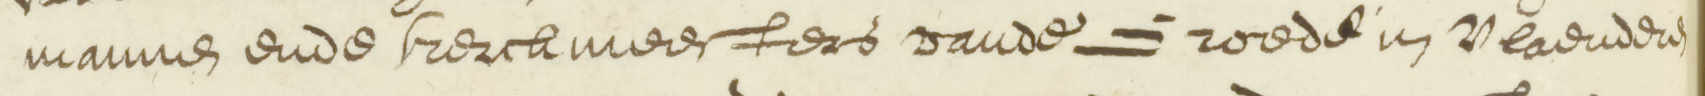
mannen ende kerckmeesters vande Groede in Vlaenderen.
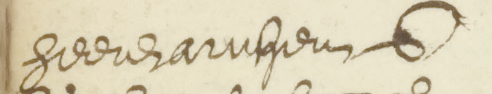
heeren arnhem &
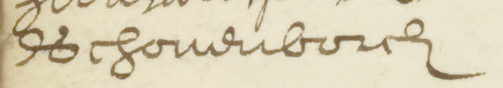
Schonenborch
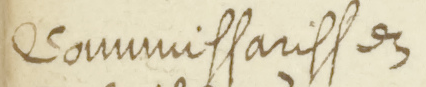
Commissarissen
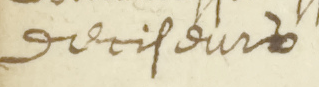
Deciseurs
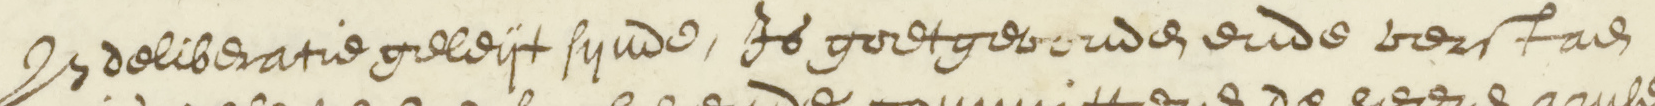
In deliberatie geleijt synde, Is goetgevonden ende verstaen
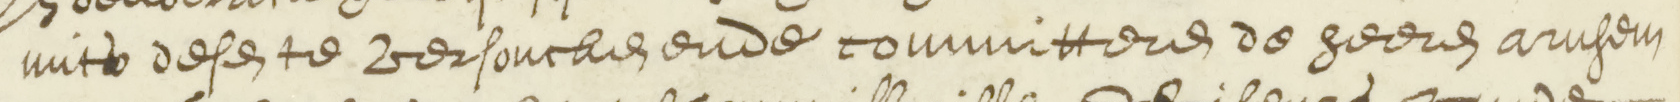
mits desen te versoucken ende committeren de heeren arnhem
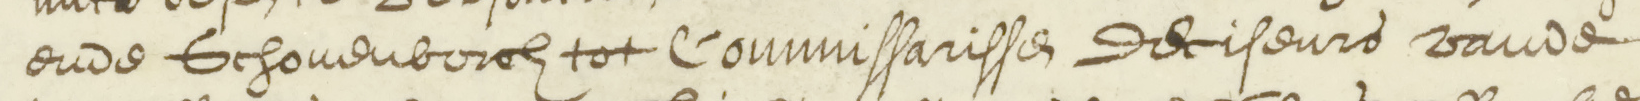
ende Schonenborch tot Commissarissen Deciseurs vande
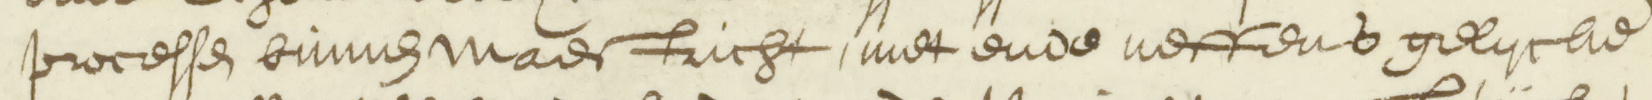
processen binnen Maestricht, met ende neffens gelycke
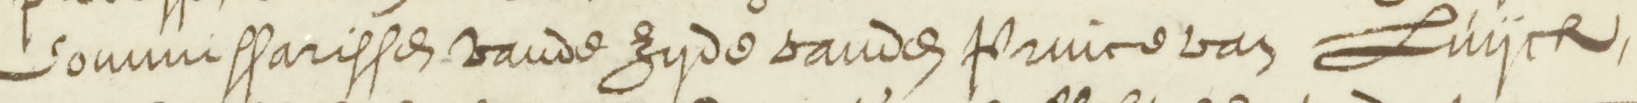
Commissarissen vande zyde vanden Prince van Luijck,
